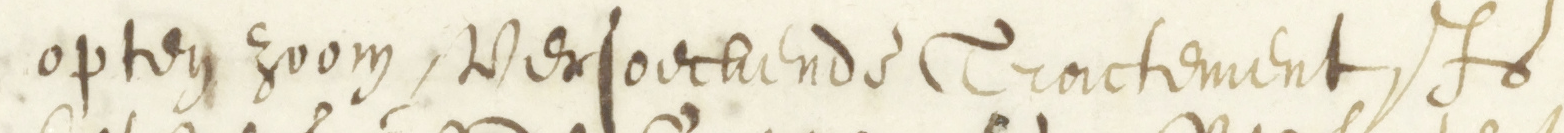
op ten zoom, versoeckende Tractement, Is
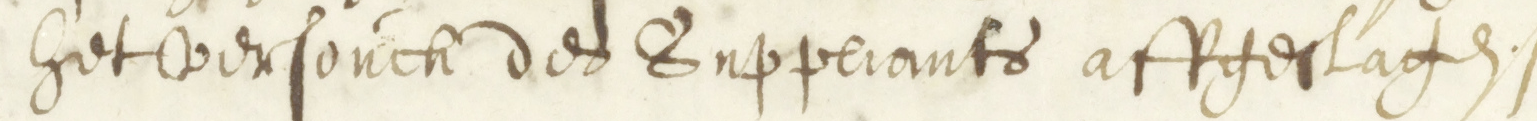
het versouck des Suppliants affgeslagen.
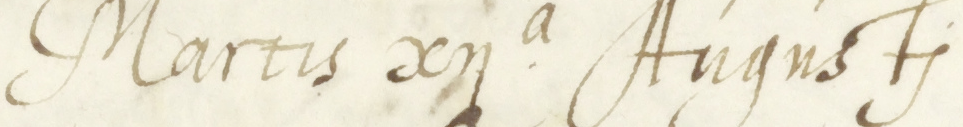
Martis xija. Augusti
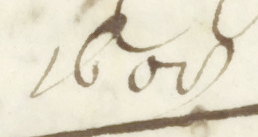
1608
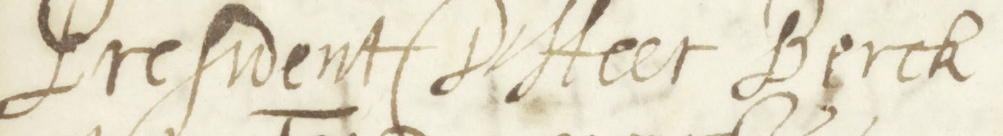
President D'Heer Berck
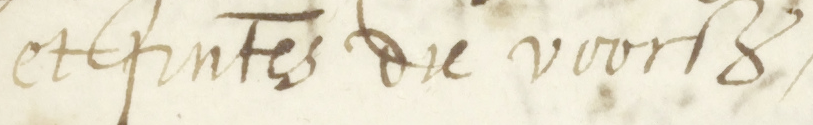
et pntes die voors
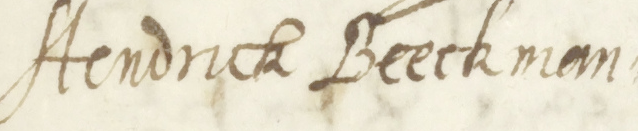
Hendrick Beeckman
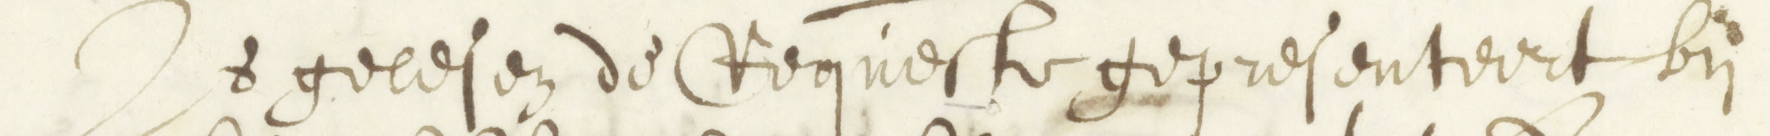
Is gelesen de Requeste gepresenteert bij
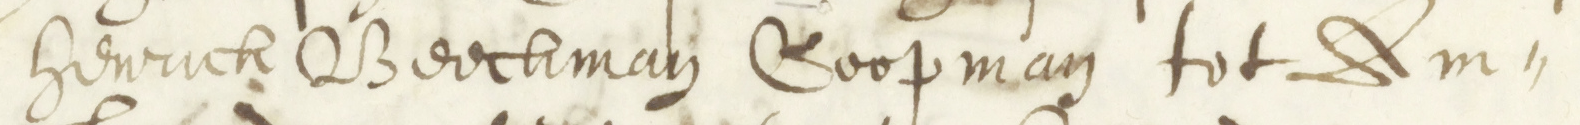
henrick Beeckman Coopman tot Am,,
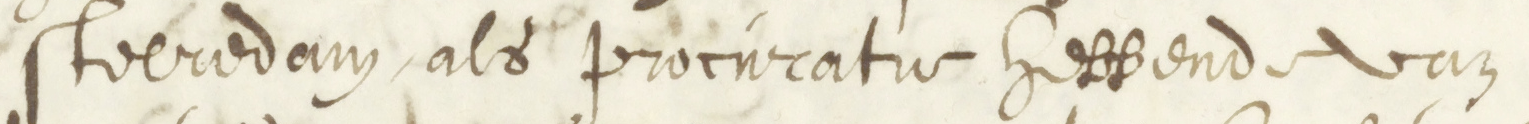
stelredam, als procuratie hebbende van
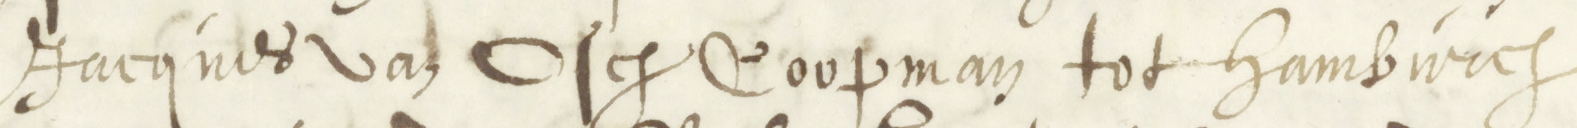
Jacques van Osch Coopman tot Hamburch
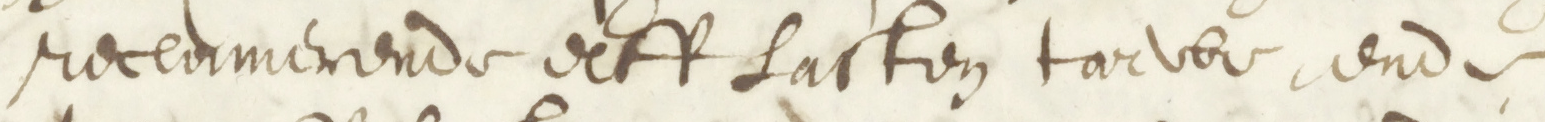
reclamerende elff lasten tarwe, ende
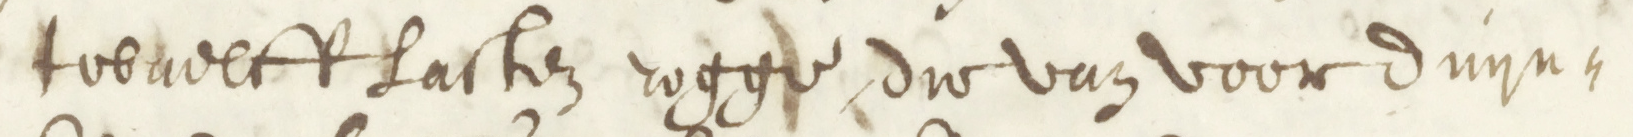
twaelff lasten rogge, die van voor duijn,,
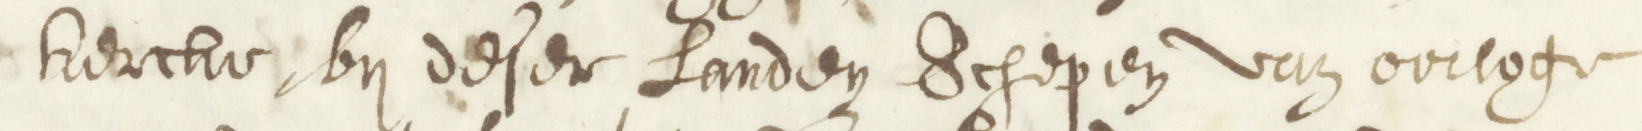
kercke, bij deser landen Schepen van oorloge
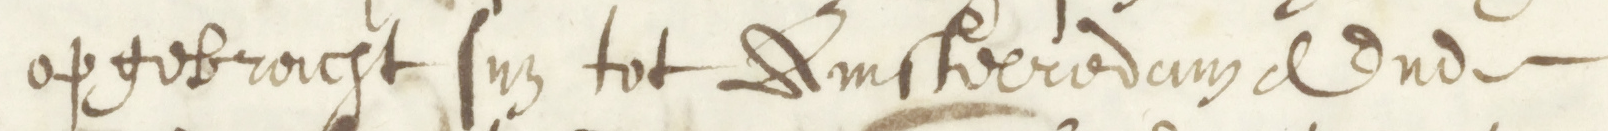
opgebracht syn tot Amstelredam Ende
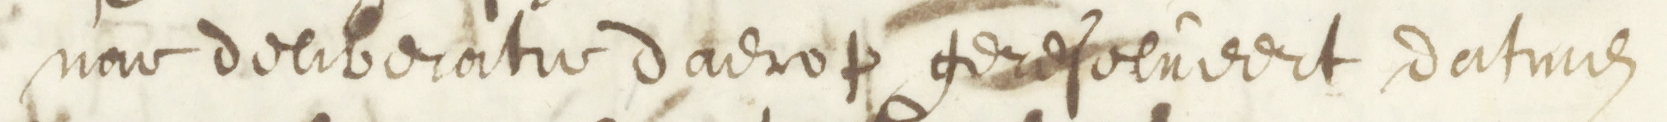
nae deliberatie daerop geresolueert, datmen
